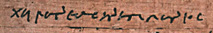χαιρωνεωϲαναμμωνιοϲ
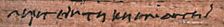παραγενηται καιαποδωϲειν
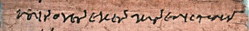ημινουενεκεντηνεπιϲτολην
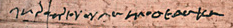τηνφανιουουπωαποδεδωκα
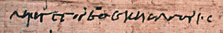παραγεγονεδεκαιαμμωνιοϲ
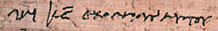τηι κϛ εχομαιουναυτου
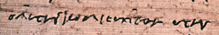οπωϲανκομιϲωμεθα ωϲαυ
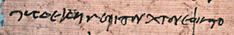τωϲδεκαιπεριτουχιουεφατο
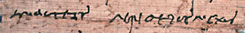αποδωϲειν περιδετωνμοϲχων
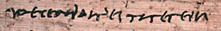ουδεϲελανθανειταγεγενη
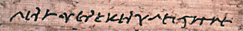μεναουενεκενυπεϲταλμε
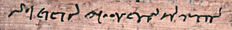νοιειϲινδιοουϲυναντωϲιν
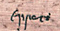ερρωϲο
